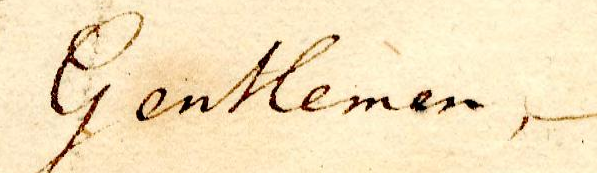Gentlemen
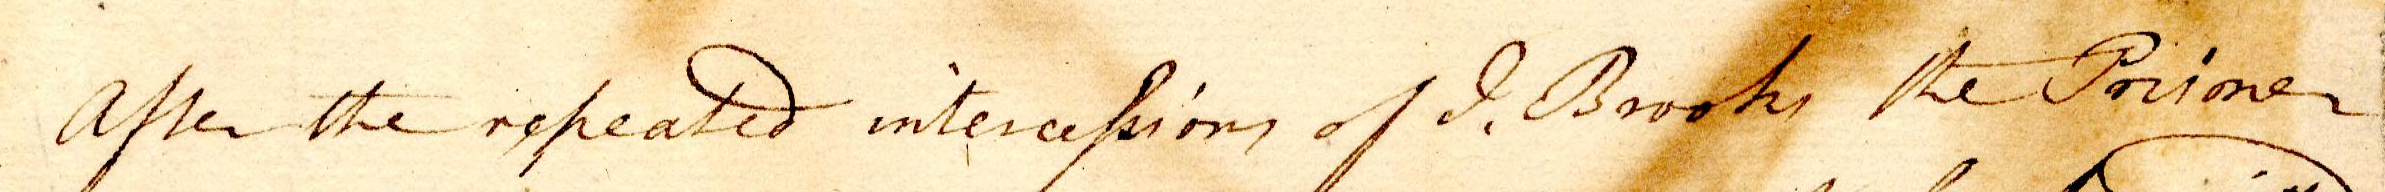After the repeated intercessions of J. Brooks the Prisoner
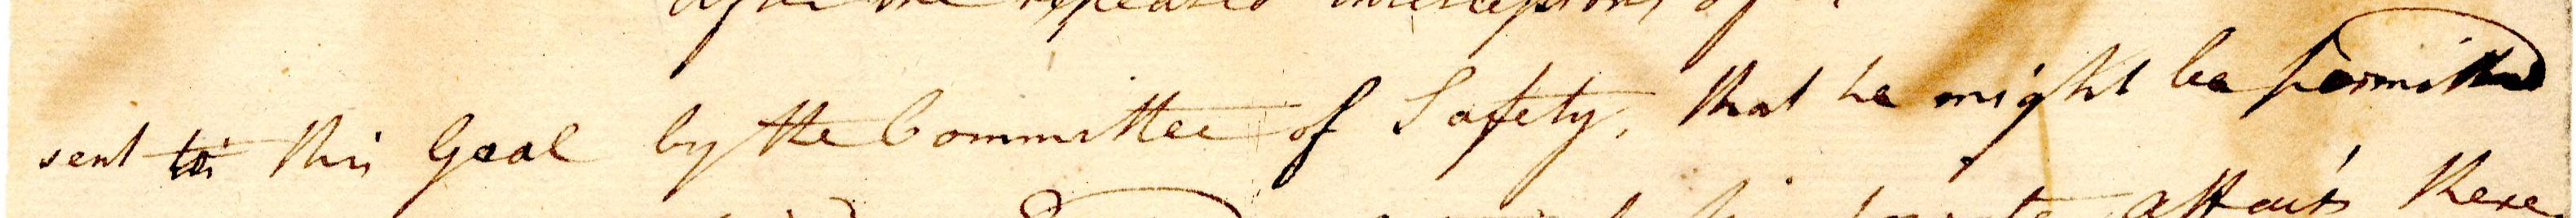sent to this Gaol by the Committee of Safety, that he might be permitted
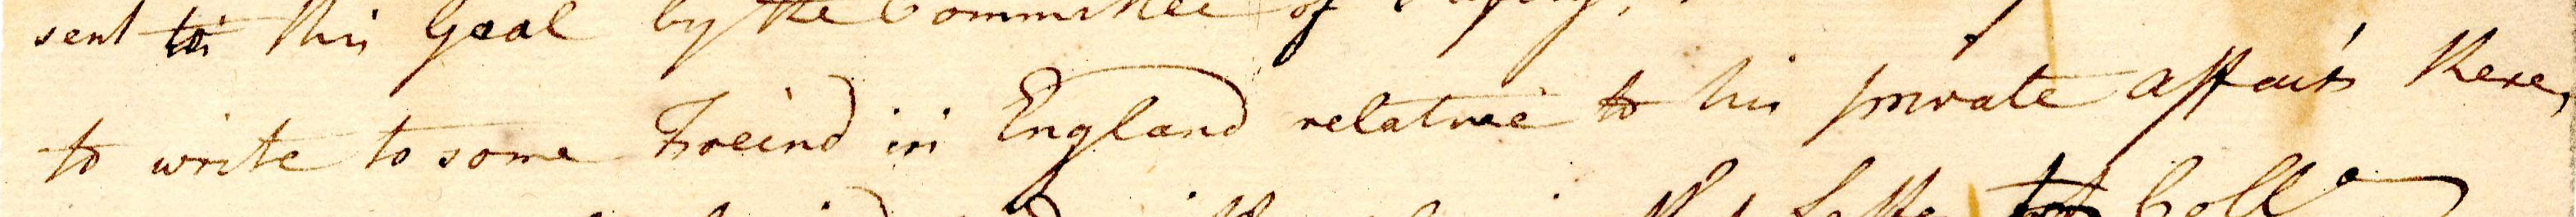to write to some Friend in England relative to his private affairs there
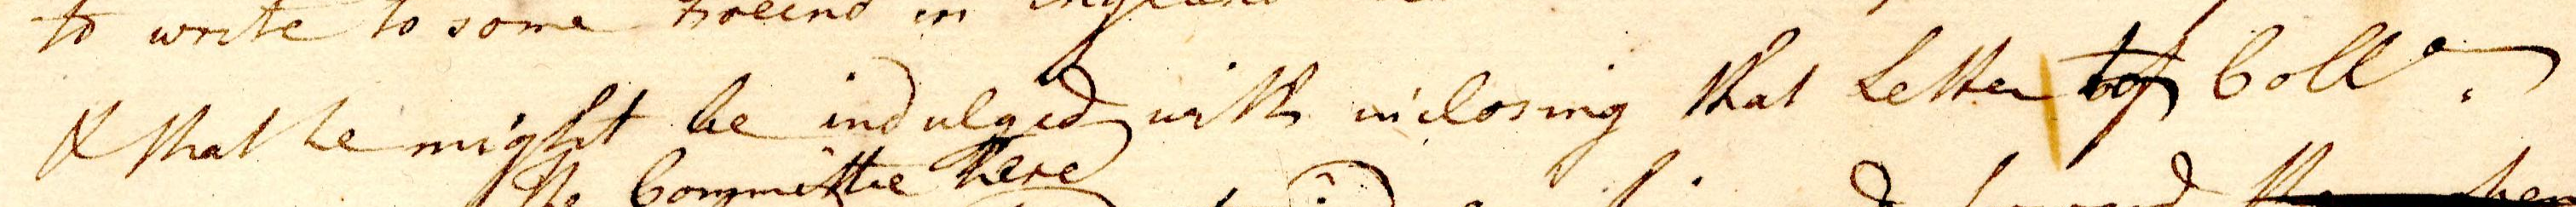& that he might be indulged with inclosing that Letter to Coll^o.
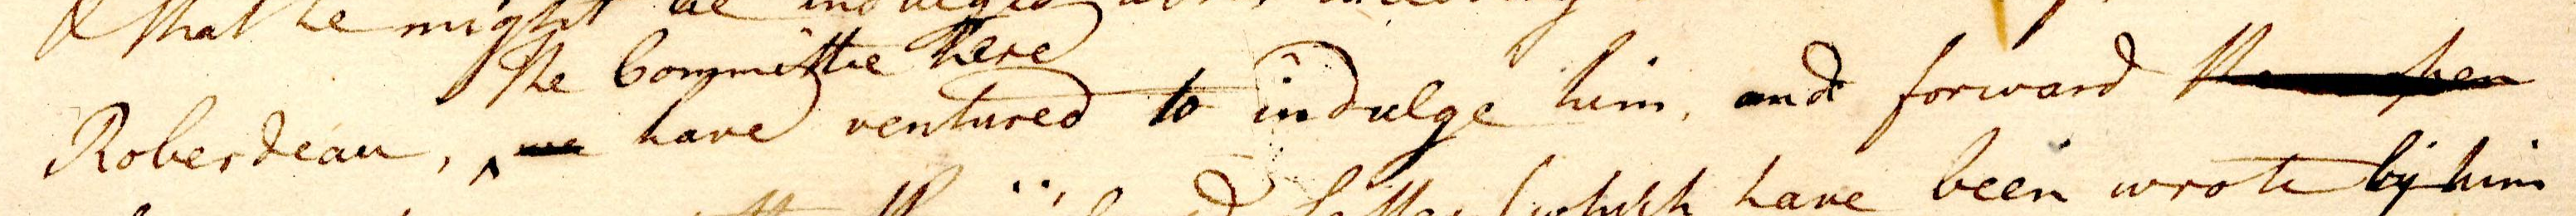Roberdeau, ^ we have ventured to indulge him, and forward [the pen]
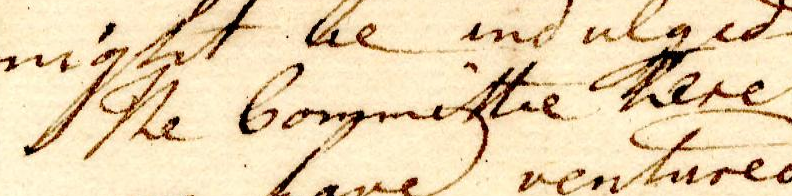The Committee here
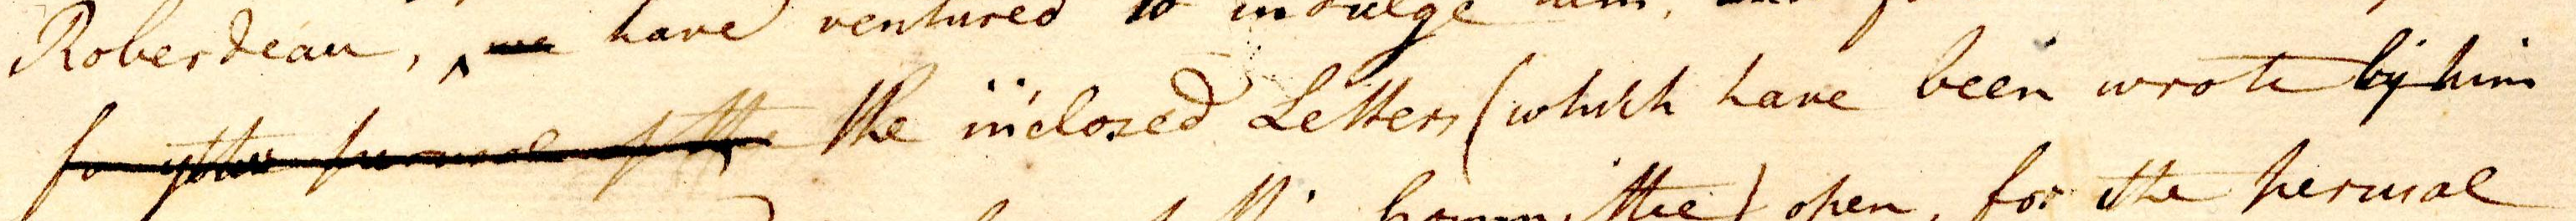[so you] [_______] [of the] inclosed Letters (which have been wrote by him
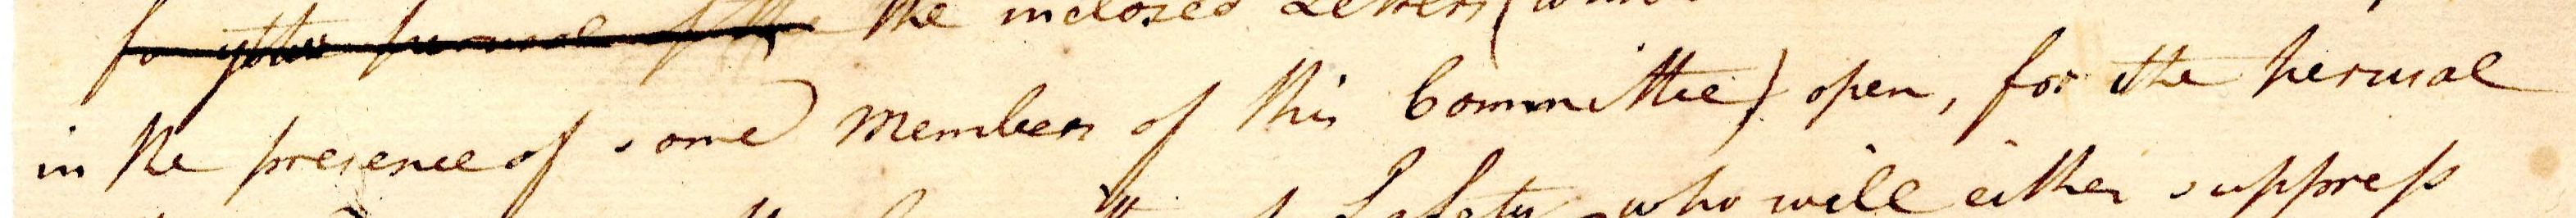in the presence of some member of this Committee) open, for the perusal
